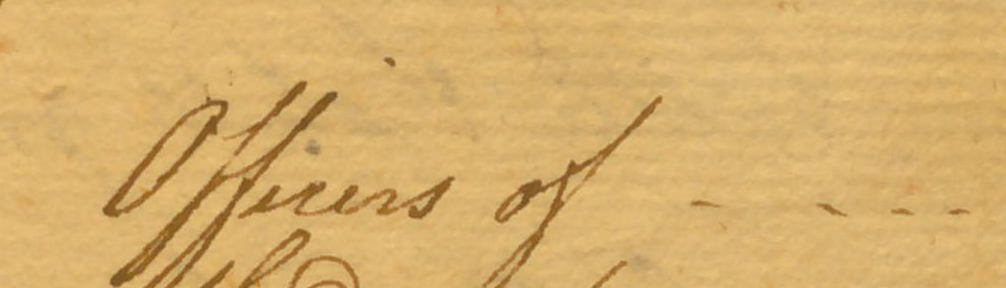Officers of ...
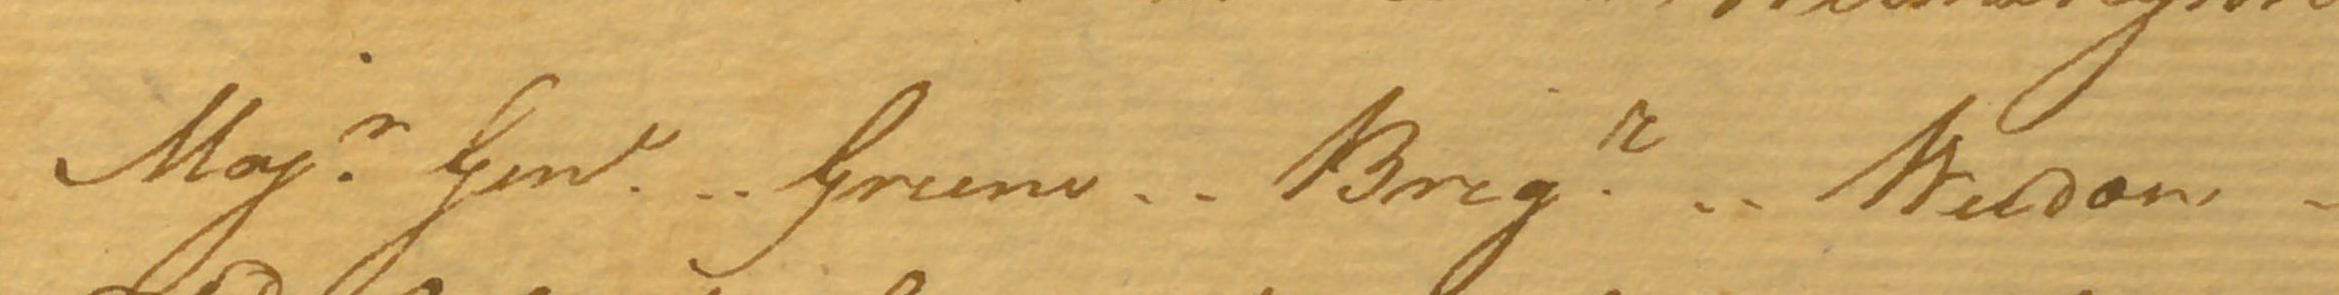Maj^r. Gen^l. .. Greene.. Brig^r. .. Weedon
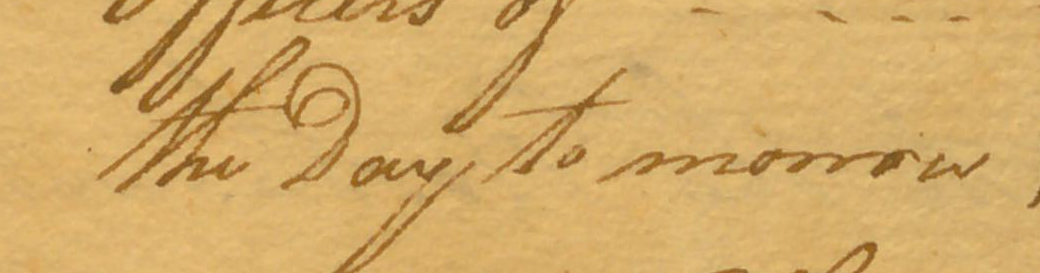the Day to morrow
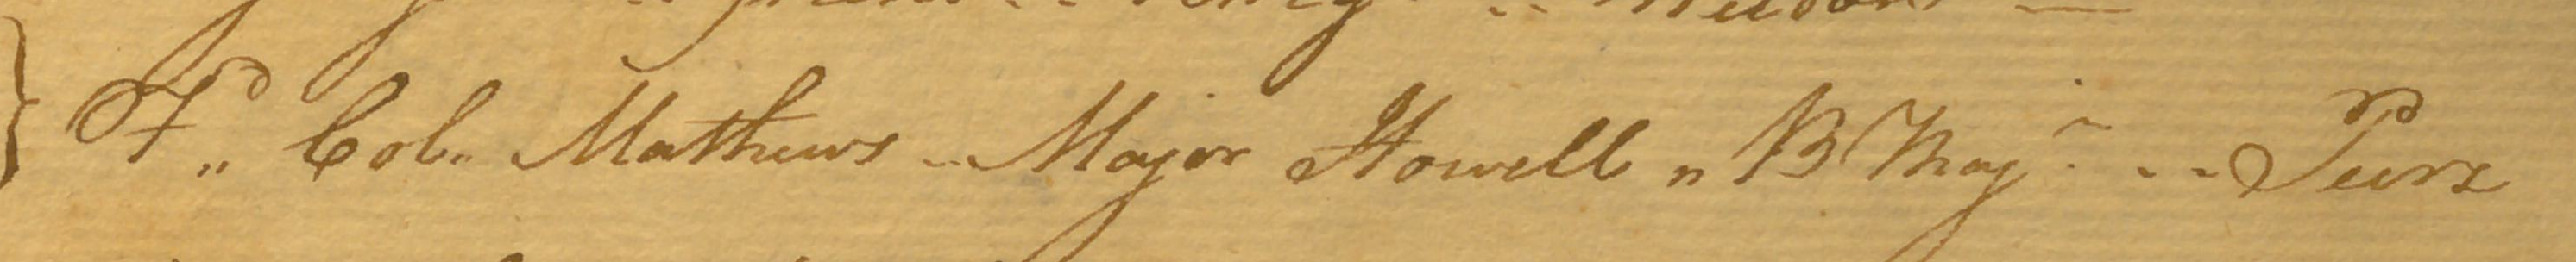F^d. Col. Mathews Major Howell. B^r Maj^r. .. Piers
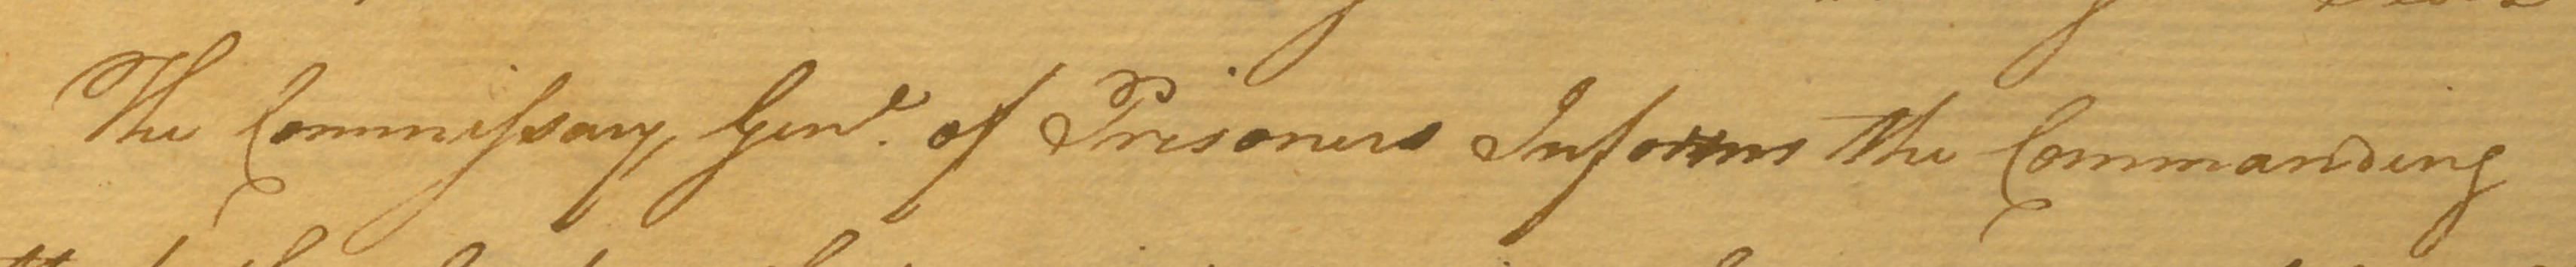The Commissary Gen^l. of Prisoners Informs the Commanding
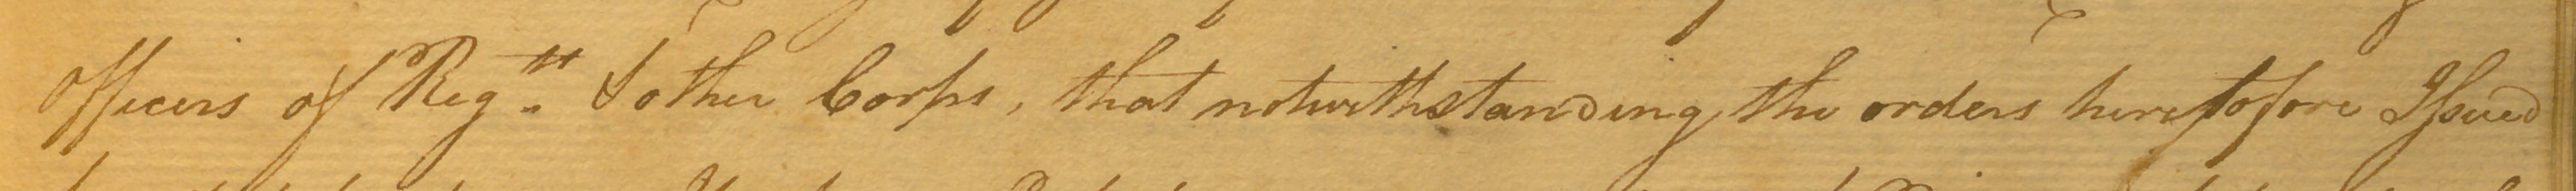Officers of Reg^ts. & other Corps, that notwithstanding the orders heretofore Issued
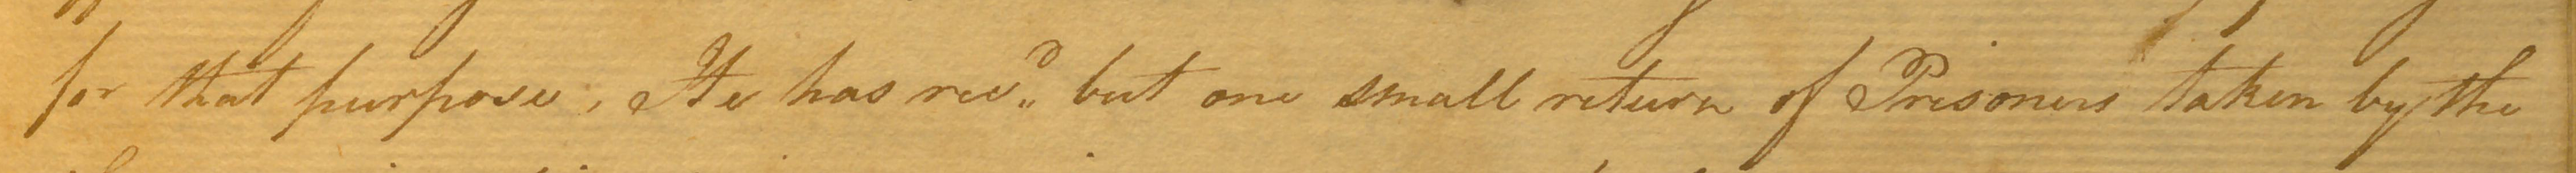for that purpose, He has rec^d. but one small return of Prisoners taken by the
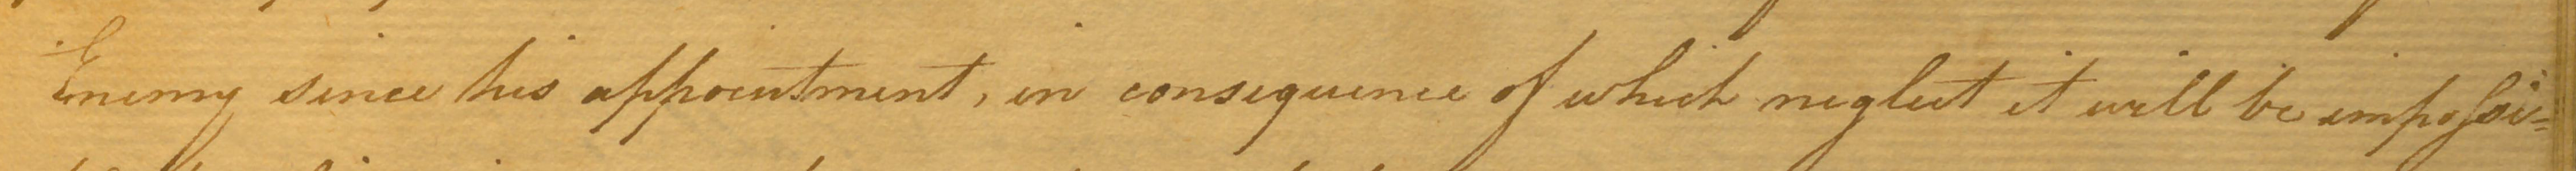Enemy since his appointment, in consequence of which neglect it will be impossible
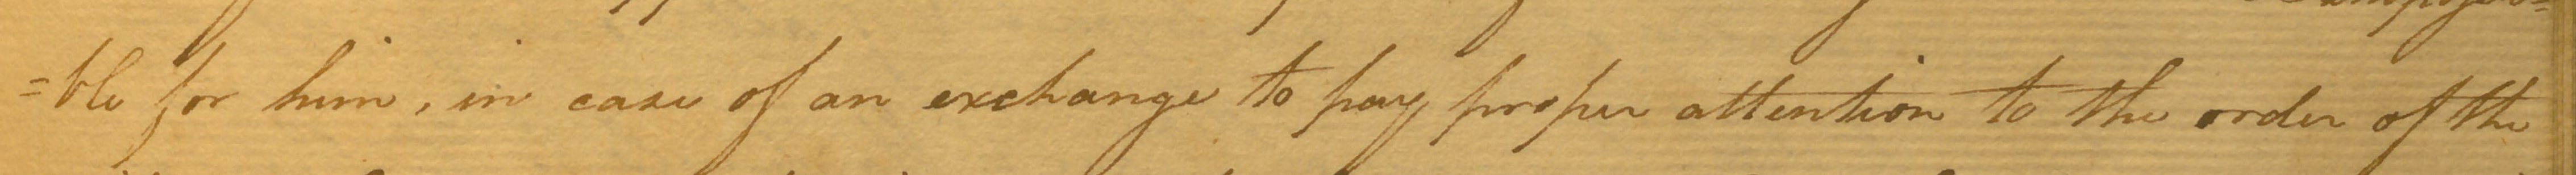-ble for him, in case of an exchange to pay proper attention to the order of the
